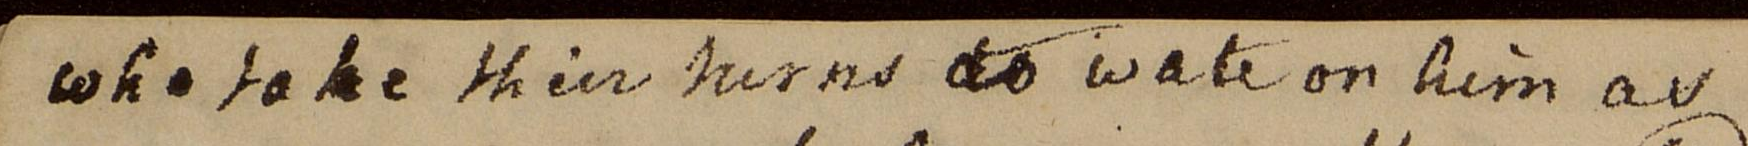who take their turns to wate on him as
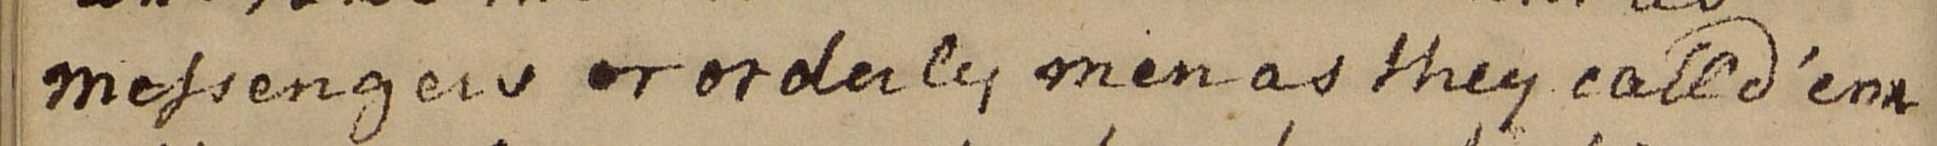messengers or orderly men as they call'd 'em
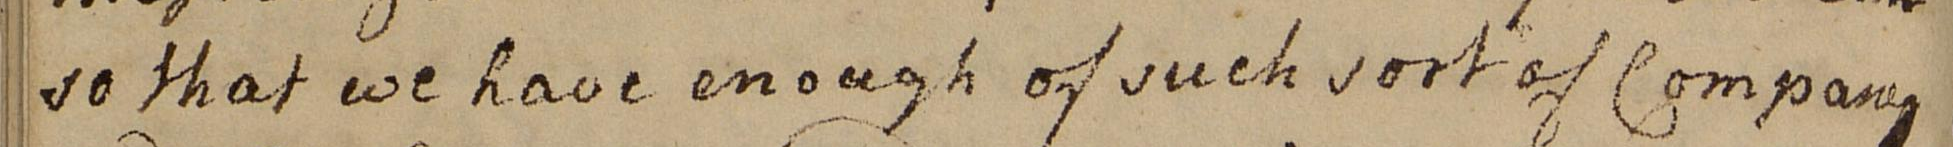so that we have enough of such sort of Company
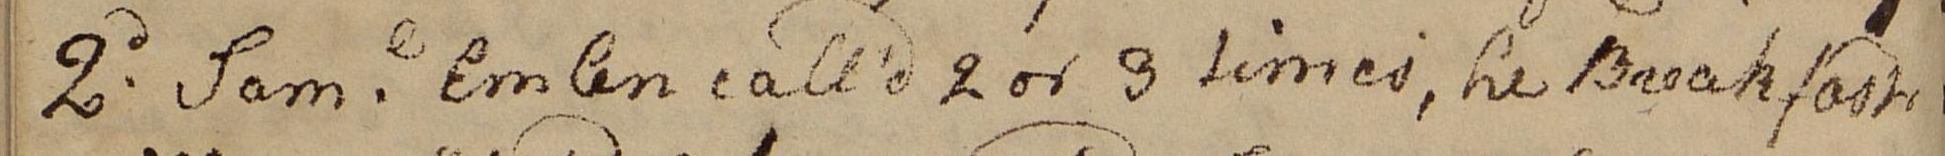2^d. Sam^l. Emlen call'd 2 or 3 times, he Breakfasts
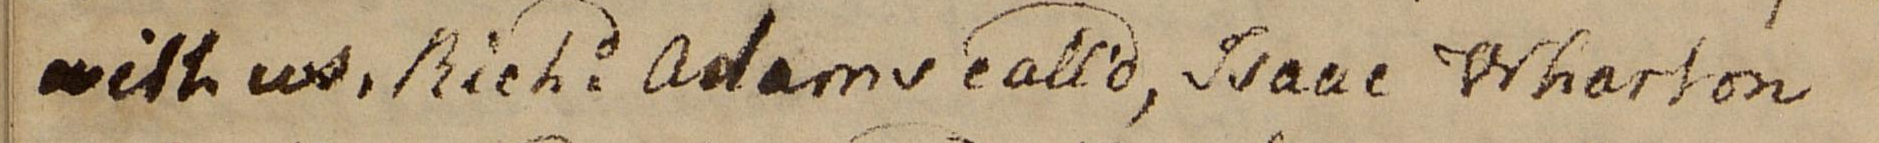with us, Rich^d Adams call'd, Isaac Wharton
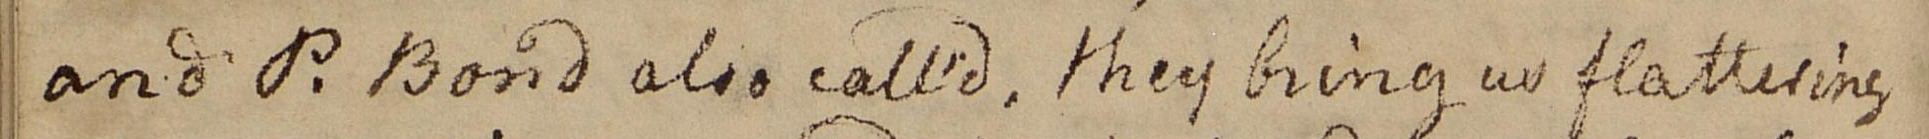and P. Bond also call'd, they bring us flattering
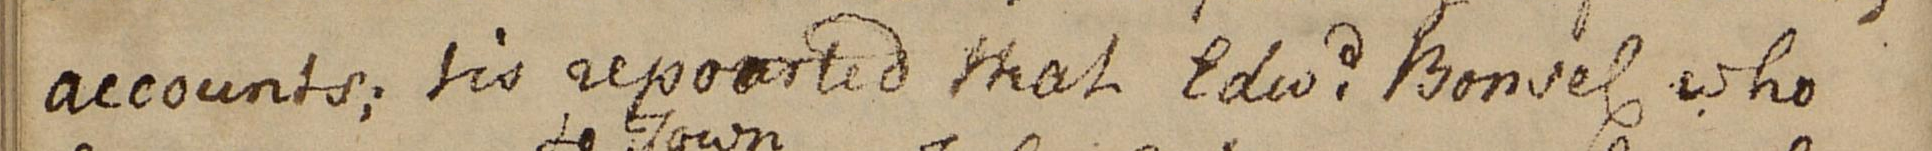accounts; tis repoarted that Edw^d. Bonsel who
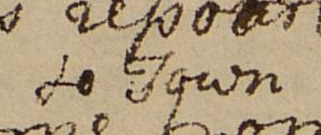to Town
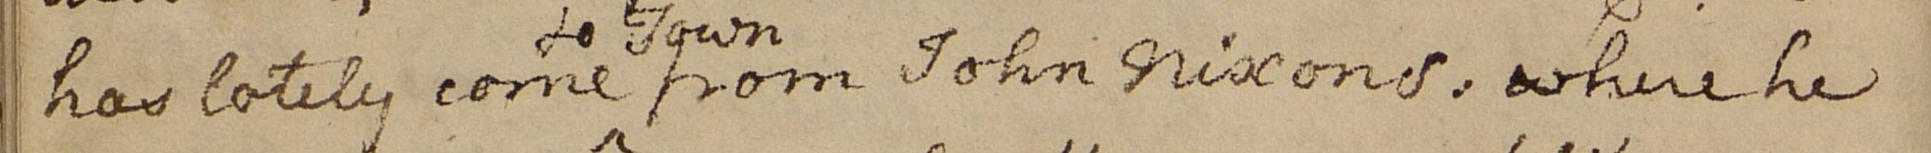has lately come ^ from John Nixons, where he
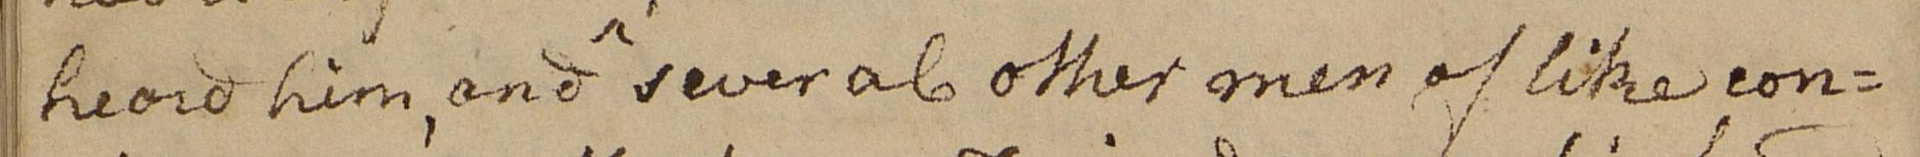heard him, and several other men of like con-
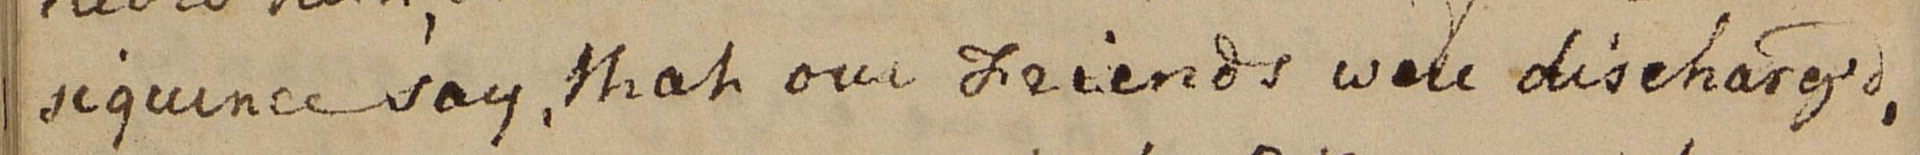sequince say, that our Friends were discharg'd,
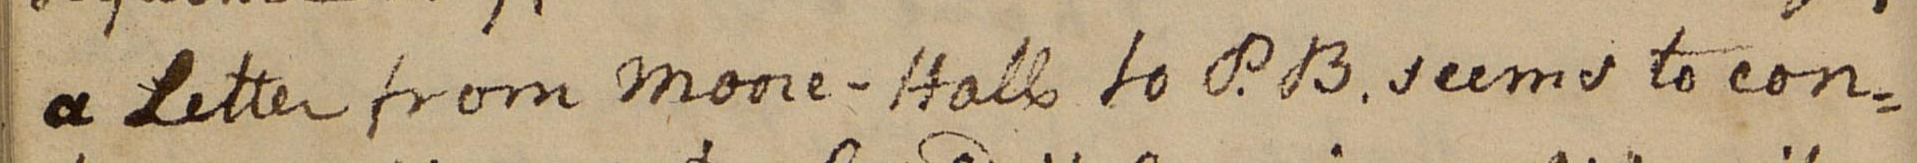a Letter from Moore- Hall to P. B. seems to con-
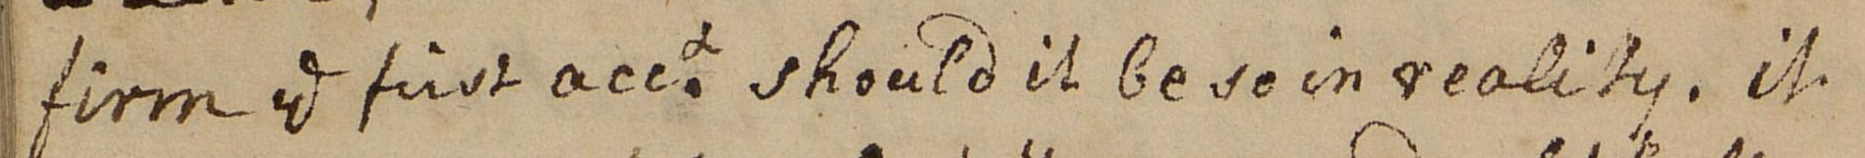firm y^e first acc^t. should it be so in reality, it
